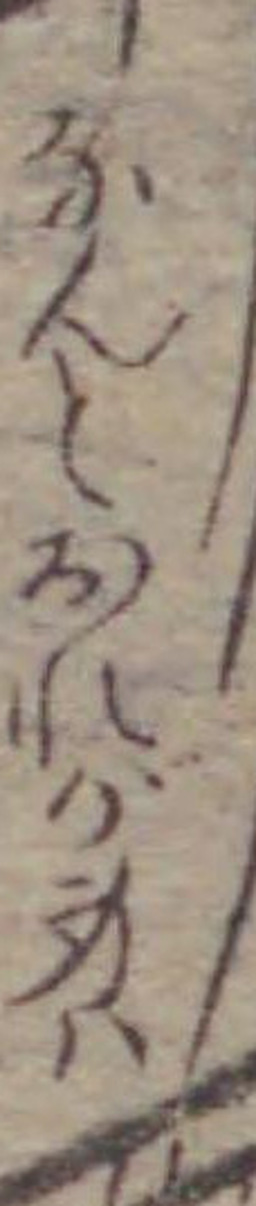なんとおれが身は
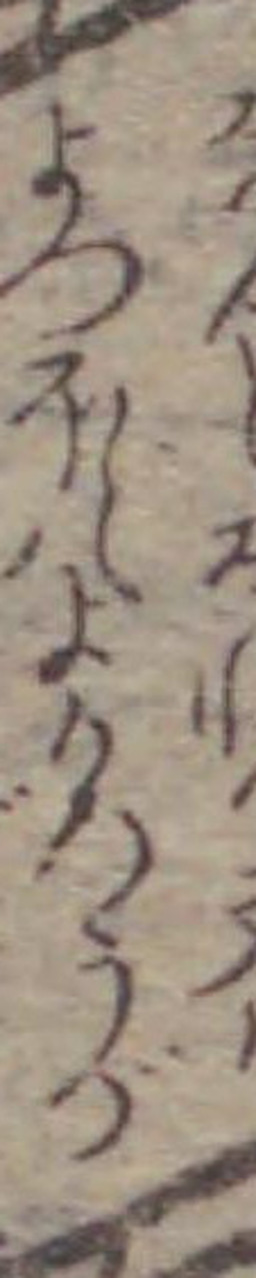よつほとよかろうが
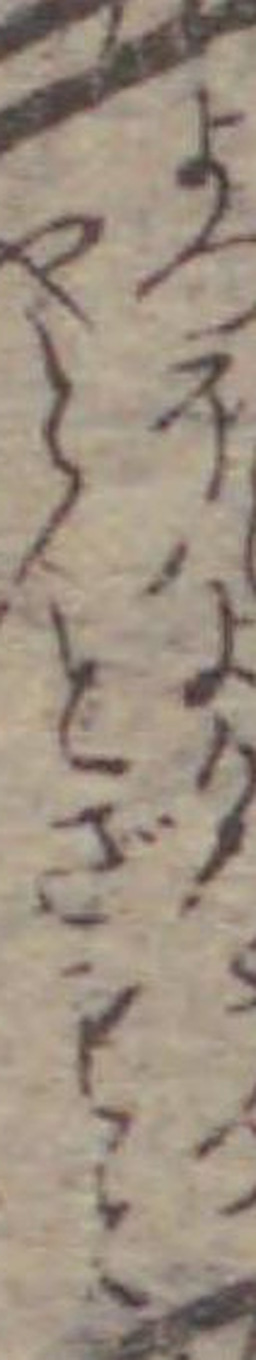やとんとざもと
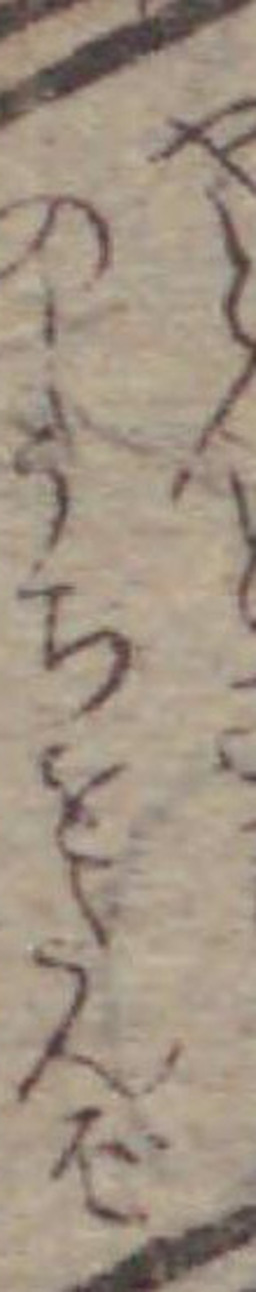のしうちをたんば
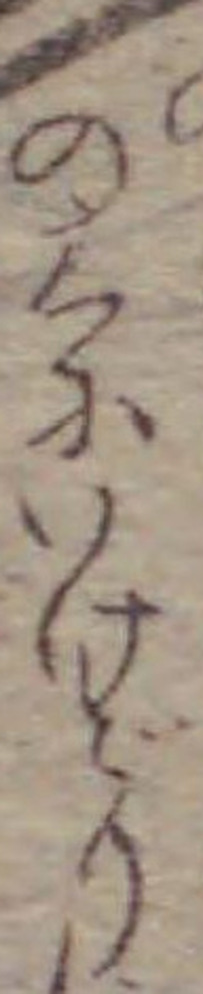のくにいけどりに
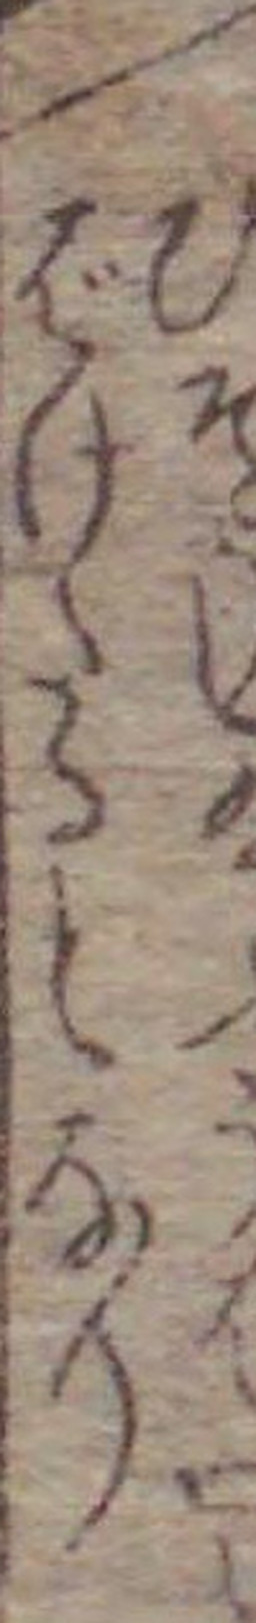ばけるとなり

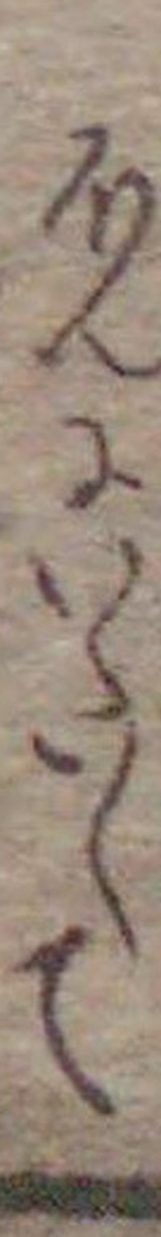ほんにいたくて
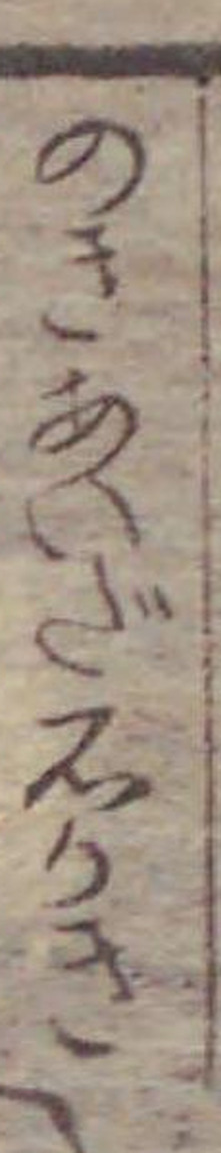のきあいだ石かき
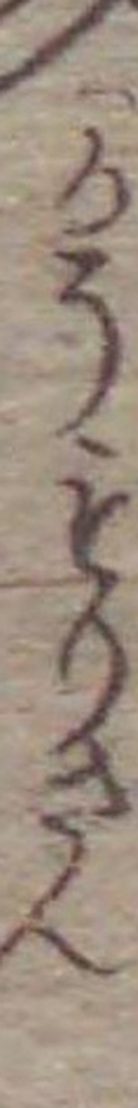〽かうもりさん
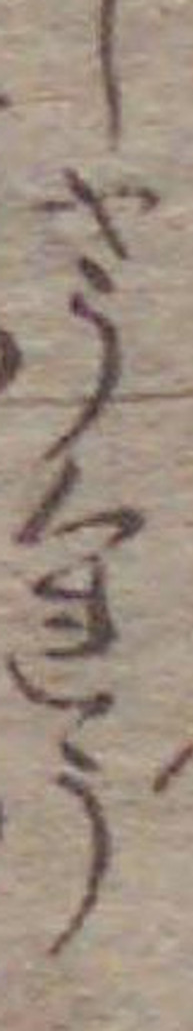しやうくれう
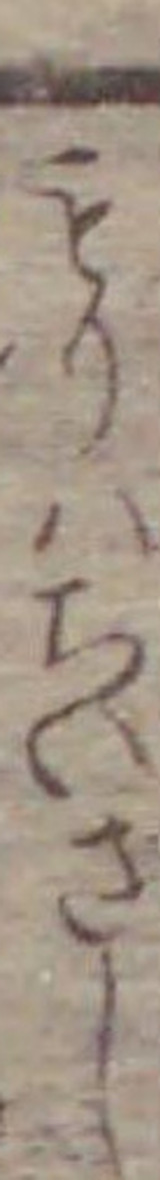もりはちいさし
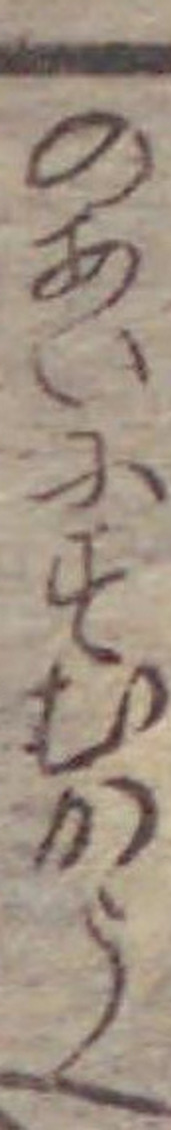のあいにすむかう
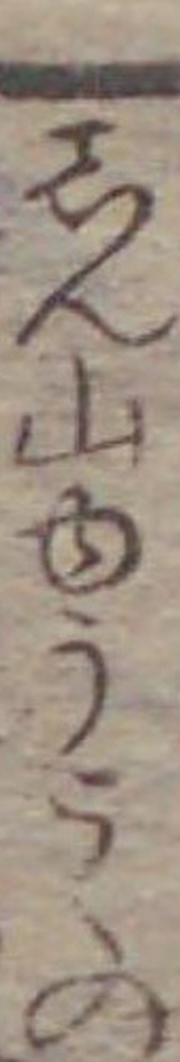しん山ゆうこくの
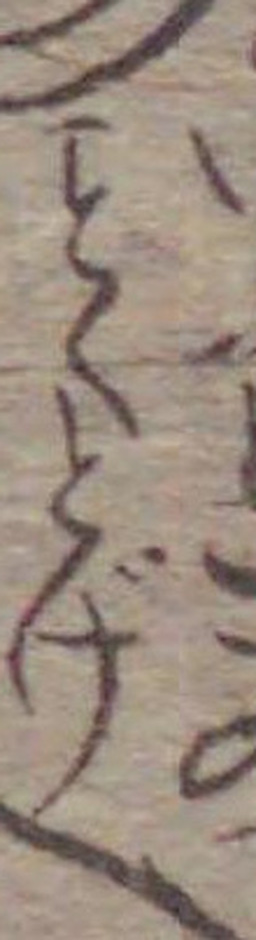ことくとげ
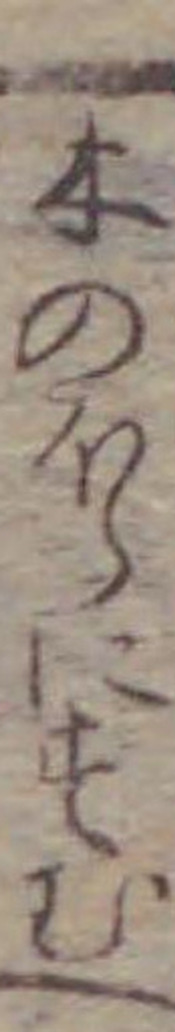木のほらにｓむ
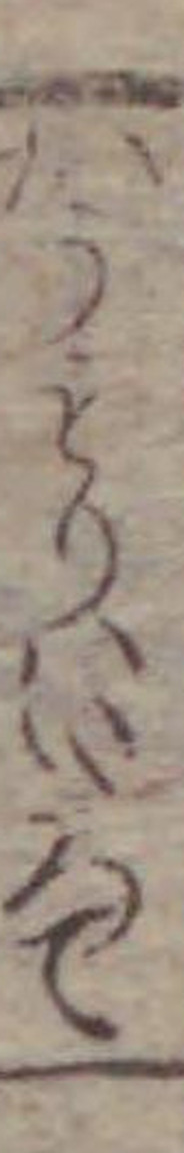かうもりはいたつて
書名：妖怪仕内評判記 : 2巻
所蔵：国立国会図書館 National Diet Library, JAPAN
